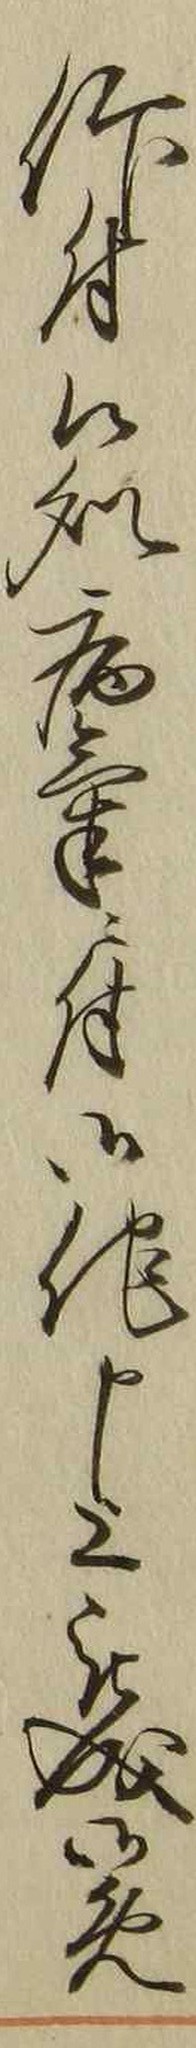仰付候処病気ニ付御侘申上被成御免
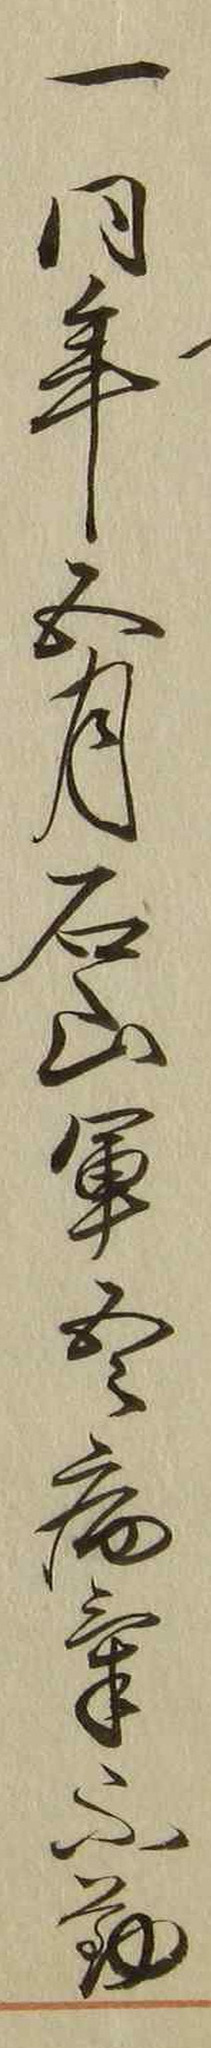一同年五月石山軍吾病気不勤
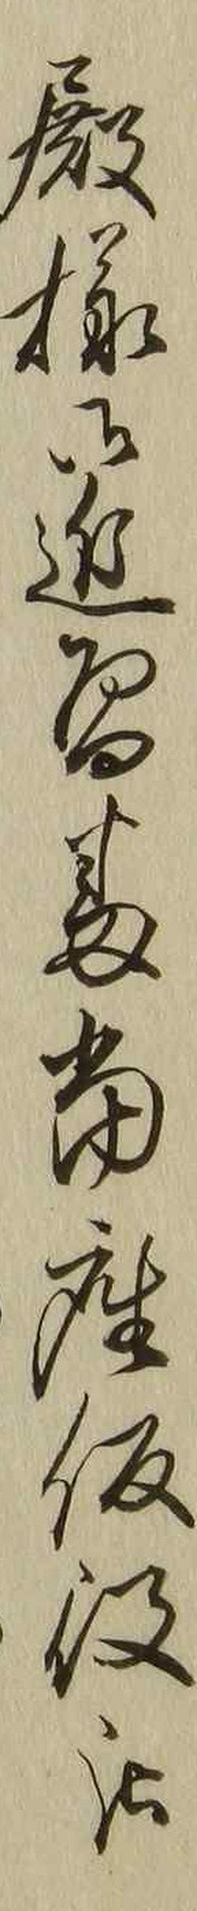殿様御近習番当座仮役被
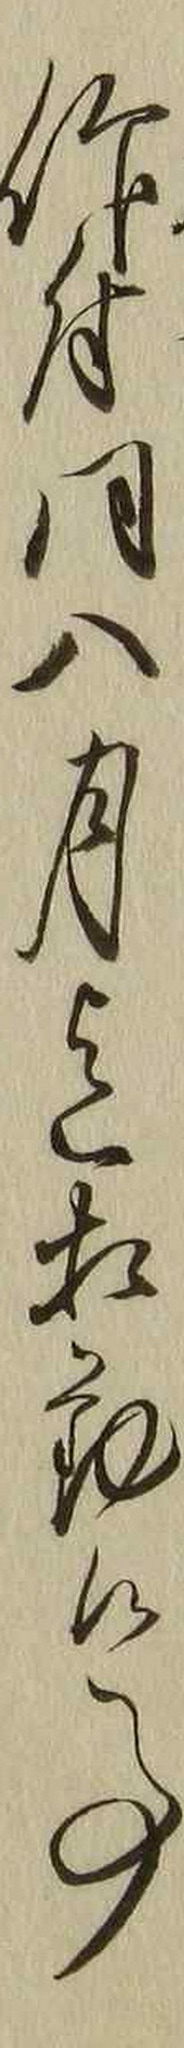仰付同八月迄相勤候事
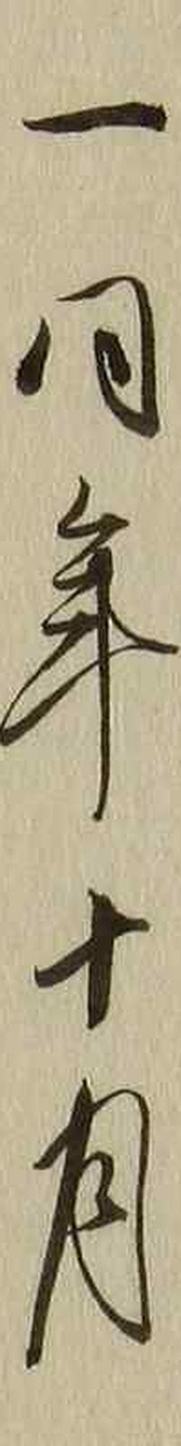一同年十月
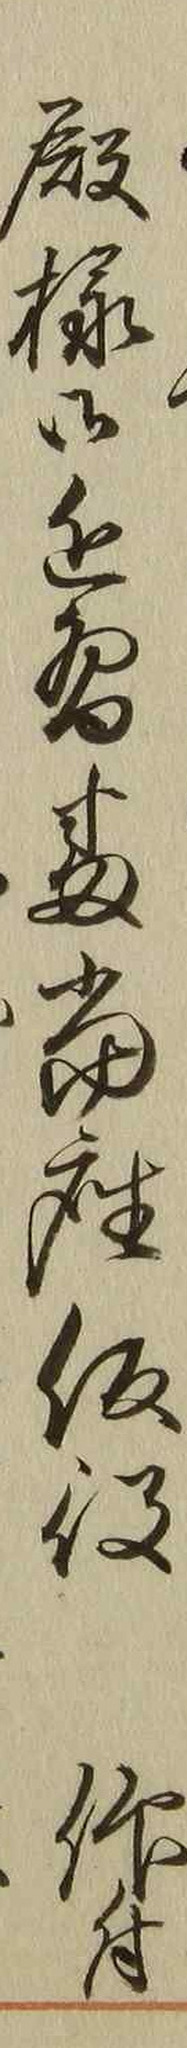殿様御近習番当座仮役仰付
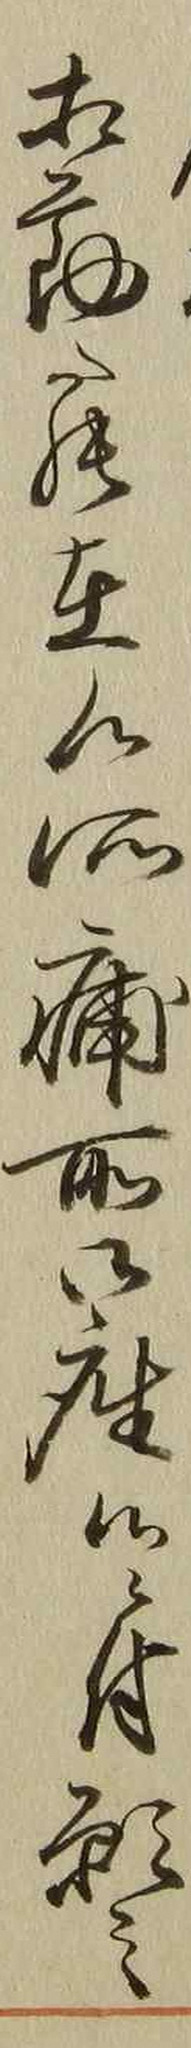相勤罷在候所痛所御座侯ニ付願之
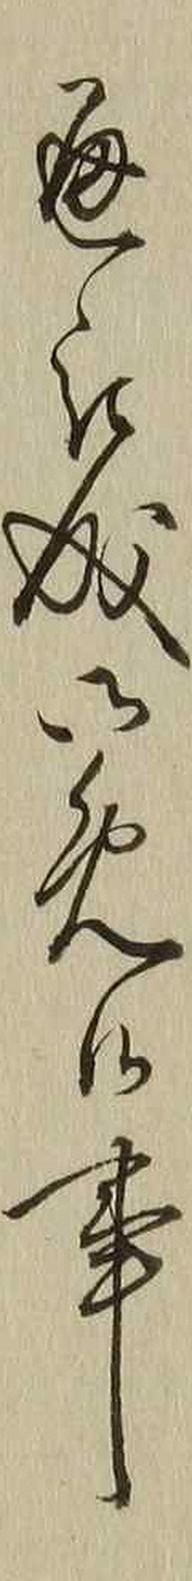通被成御免候事
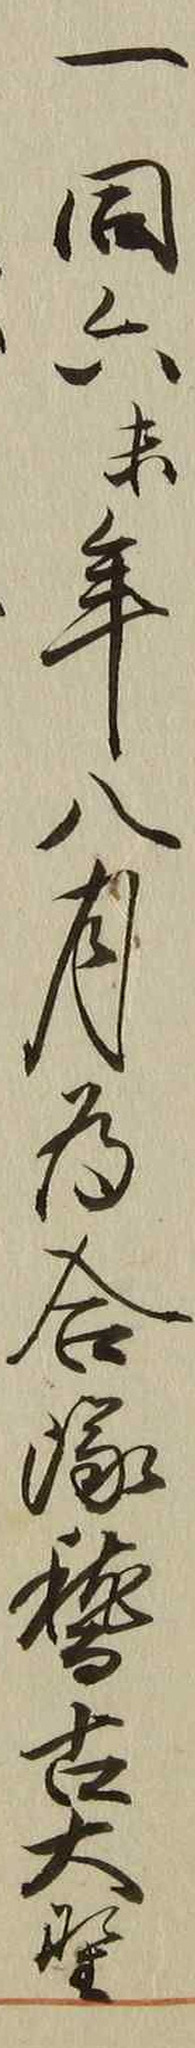一同六未年八月為合隊稽古大野
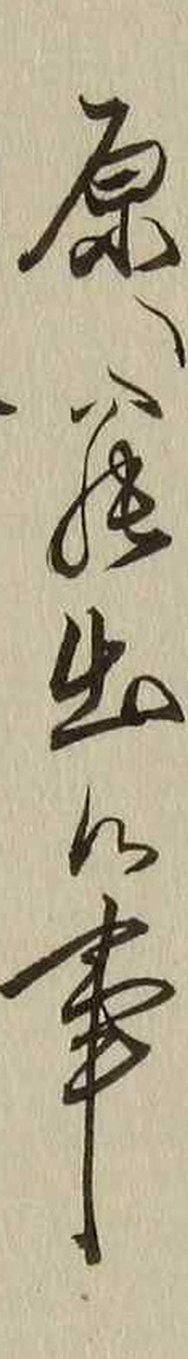原へ罷出侯事
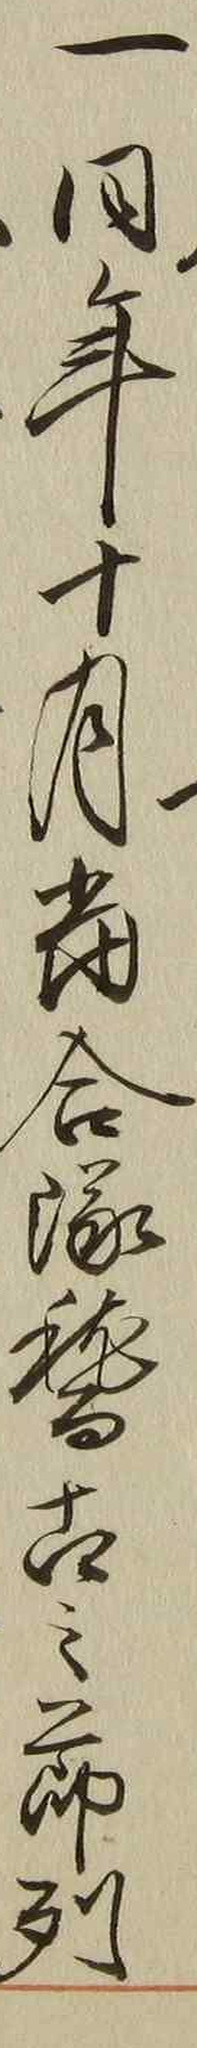一同年十月当合隊稽古之節列
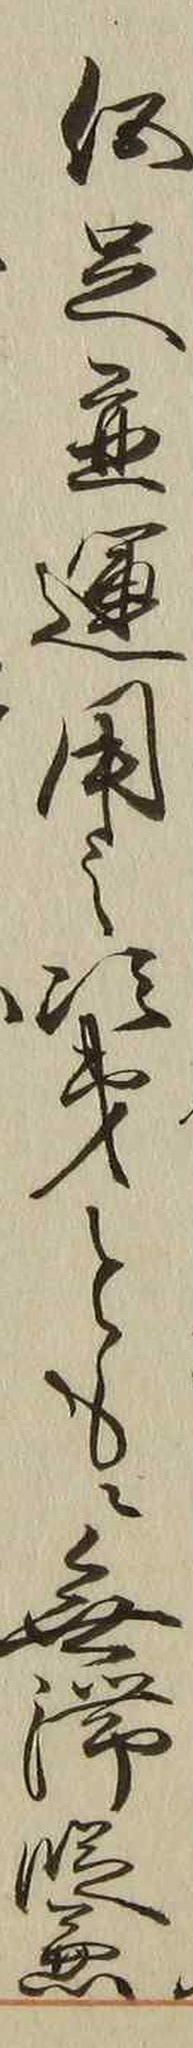伍足並運用之次第ともニ無滞段兼
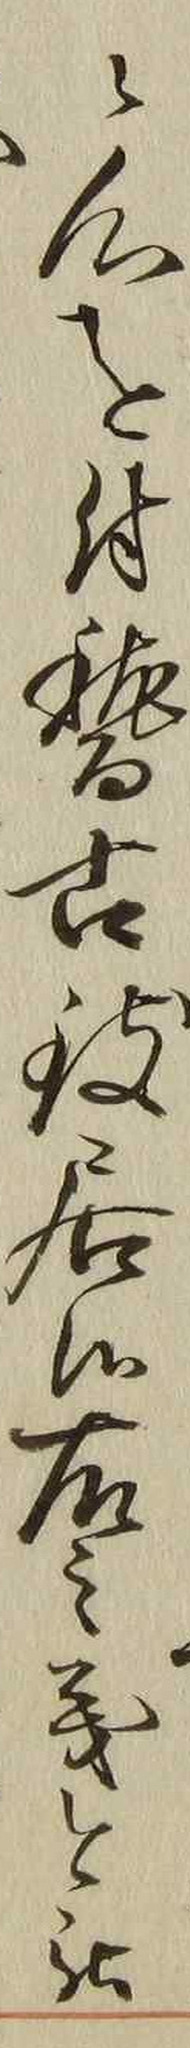々心を付稽古致居候故之義と被
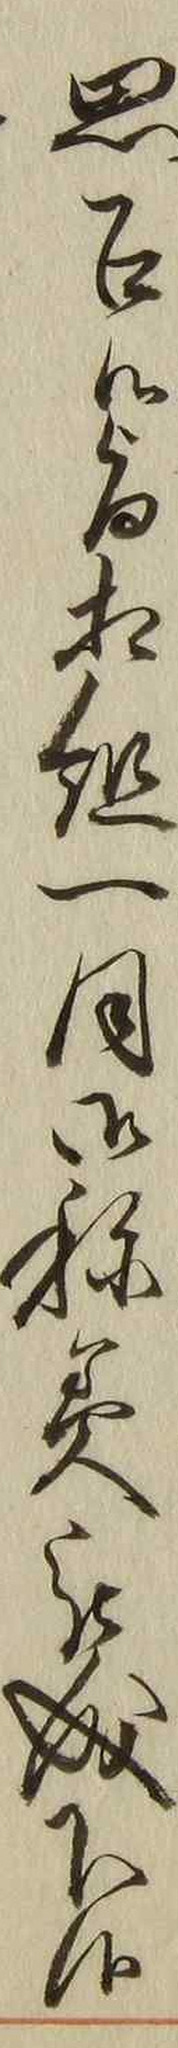思召侯旨相組一同御称美被成下候
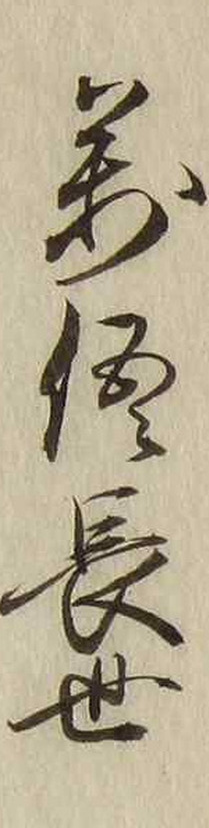万俉長世

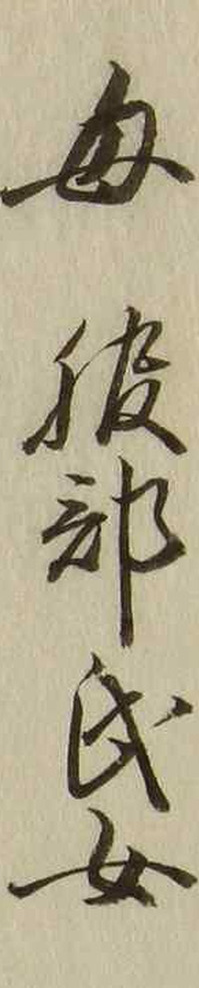母服部氏女
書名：諸士系譜　巻之57　ほ之部4
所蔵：会津若松市立会津図書館
